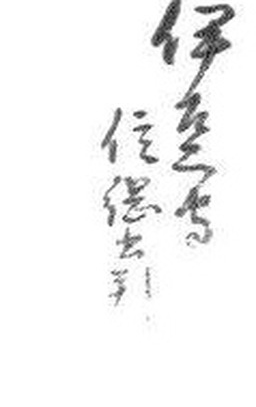信綱書判

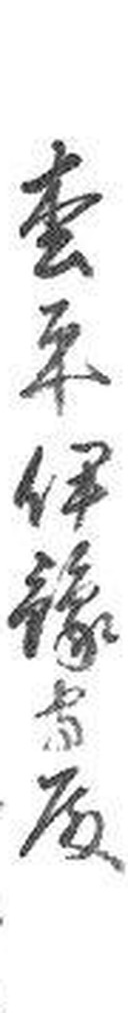松平伊豫守殿
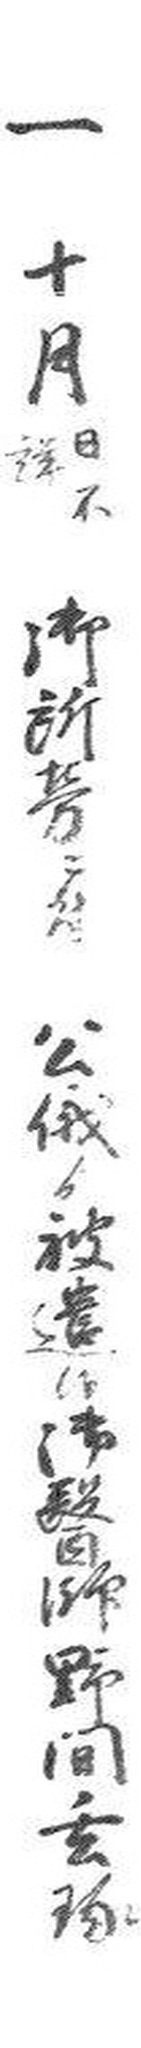一十月日不詳御所労ニ付公儀ゟ被遣候御医師野間玄琢
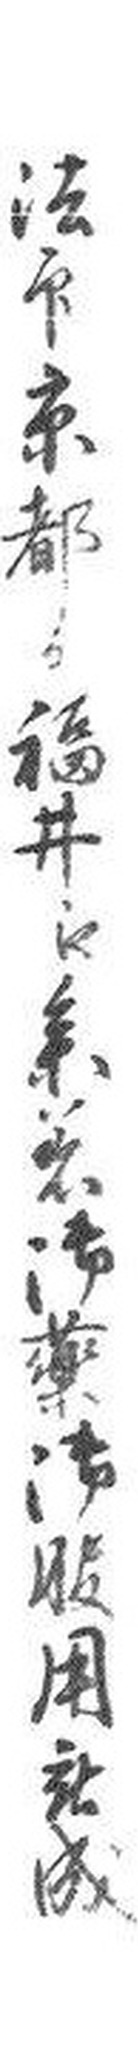法印京都ゟ福井江参着御薬御服用被成
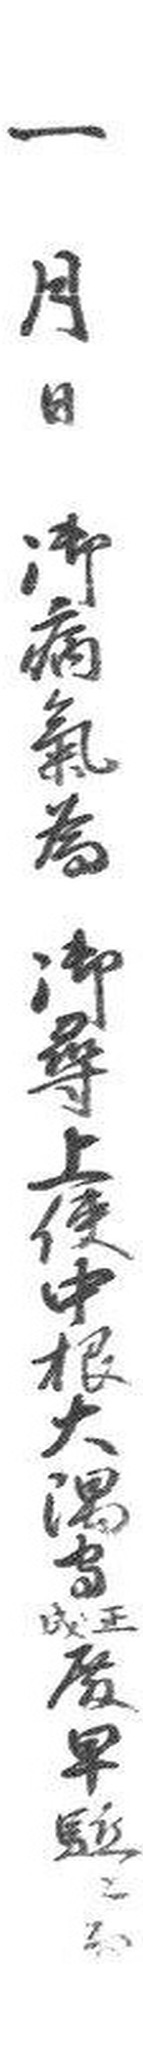一月日御病気為御尋上使中根大隅守正成殿早駈ニ而
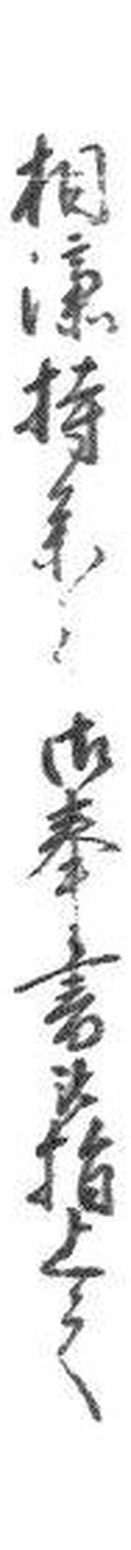相済持参之御奉書被指上之
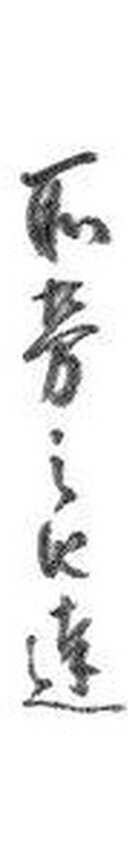所労之由達
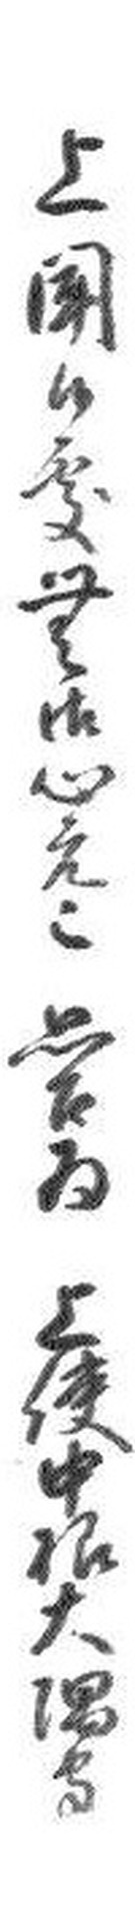上聞候処無御心元被思召為上使中根大隅守
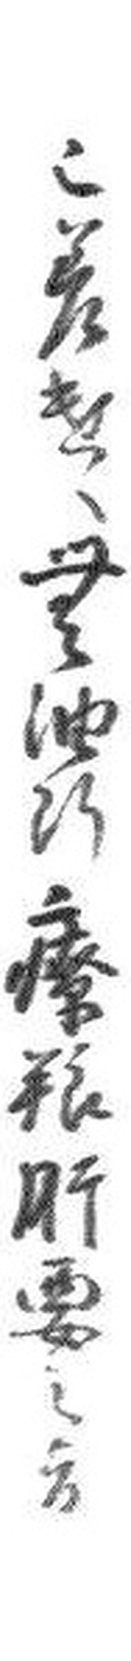被差遣候無油断療養肝要之旨
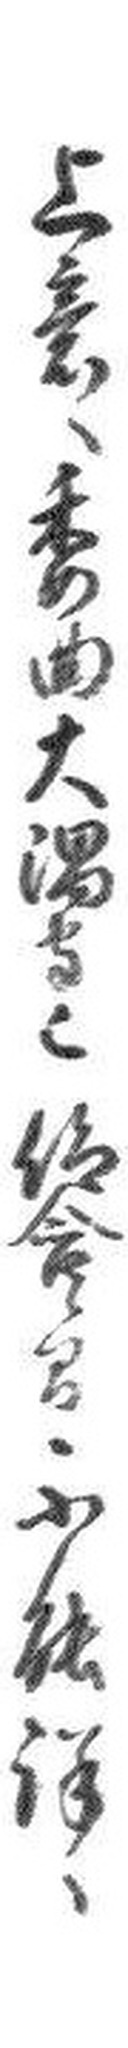上意候委曲大隅守被仰含候間不能詳候
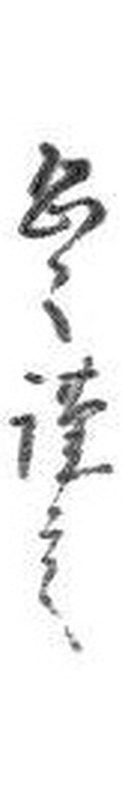恐々謹言
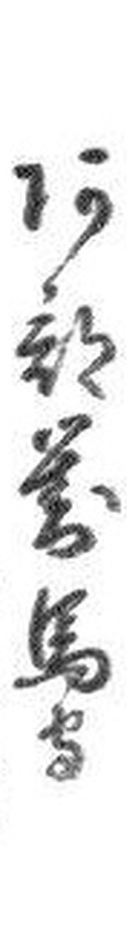阿部対馬守
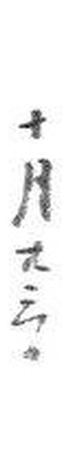十月廿三日
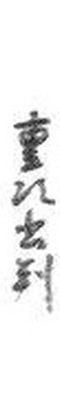重次書判
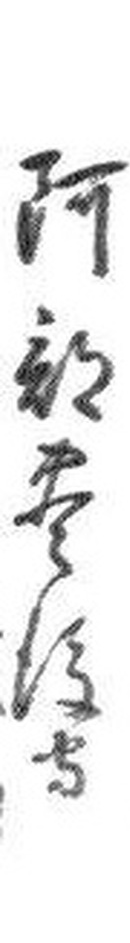阿部豊後守
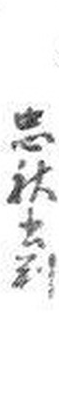忠秋書判
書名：家譜 四 忠昌公 従寛永七年到正保四年
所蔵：福井県文書館 Fukui Prefectural Archives
